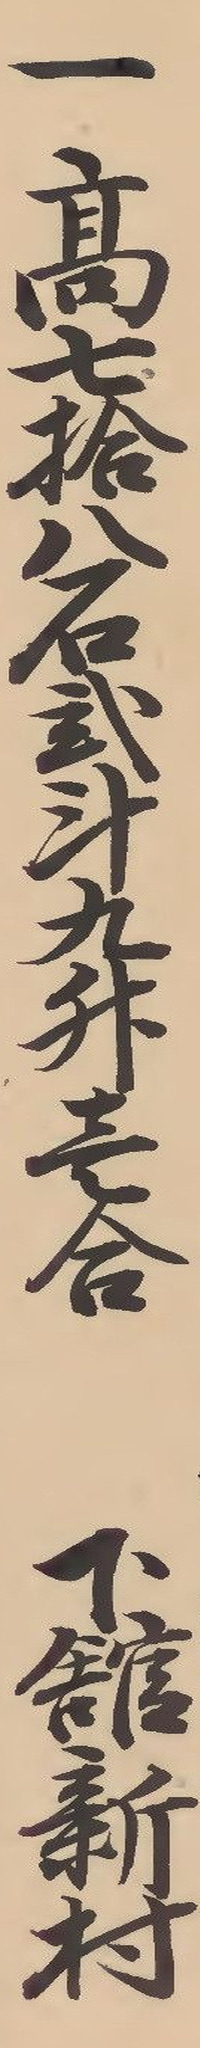一高七拾八石弐斗九升壱合下館新村
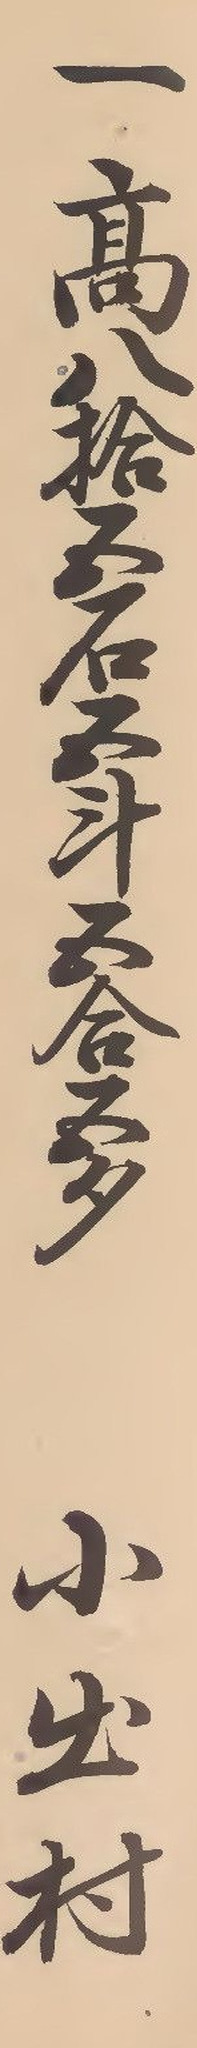一高八拾五石五斗五合五勺小出村
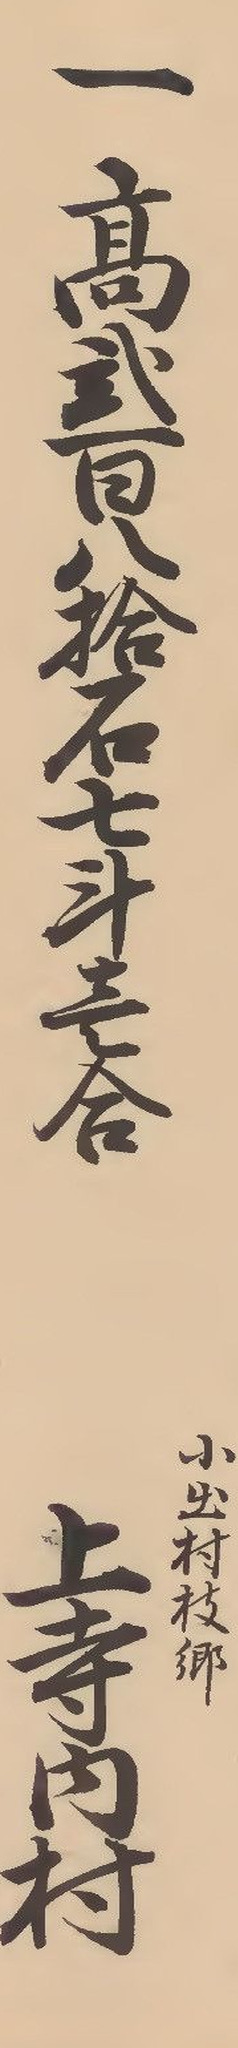一高弐百八拾石七斗壱合上寺内村
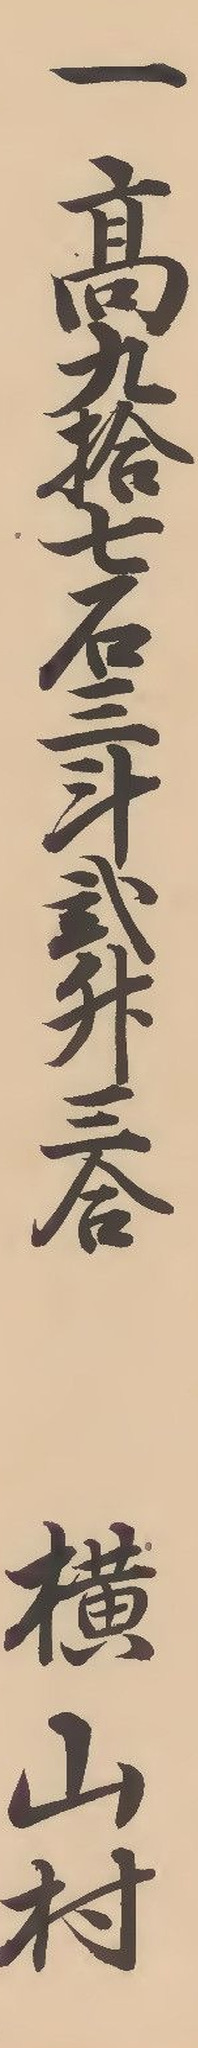一高九拾七石三斗弐升三合横山村
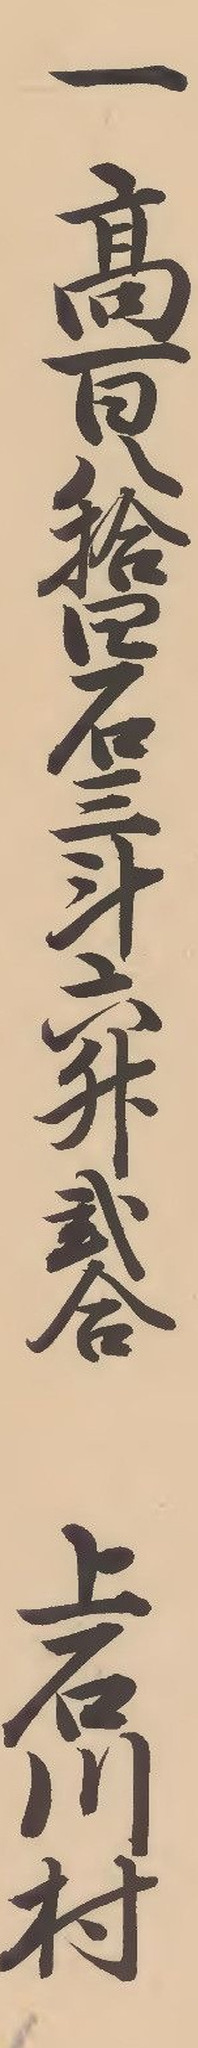一高百八拾四石三斗六升弐合上石川村

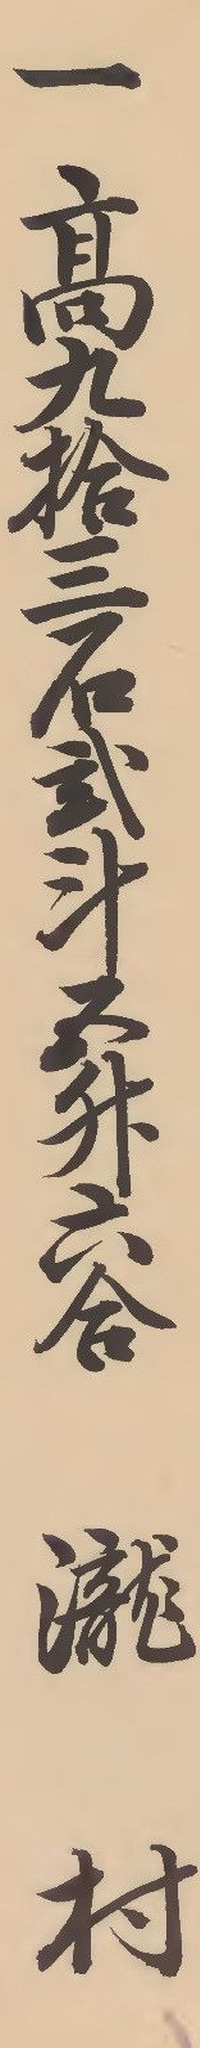一高九拾三石弐斗五升六合滝村
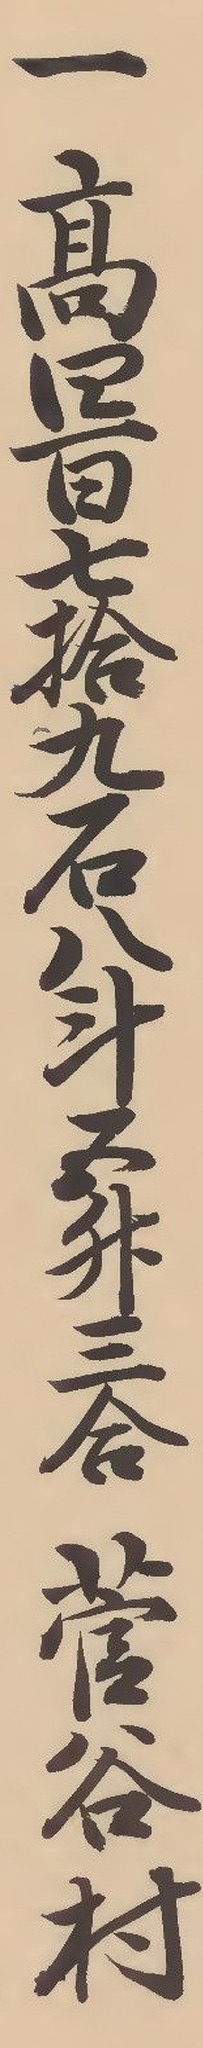一高四百七拾九石八斗五升三合菅谷村
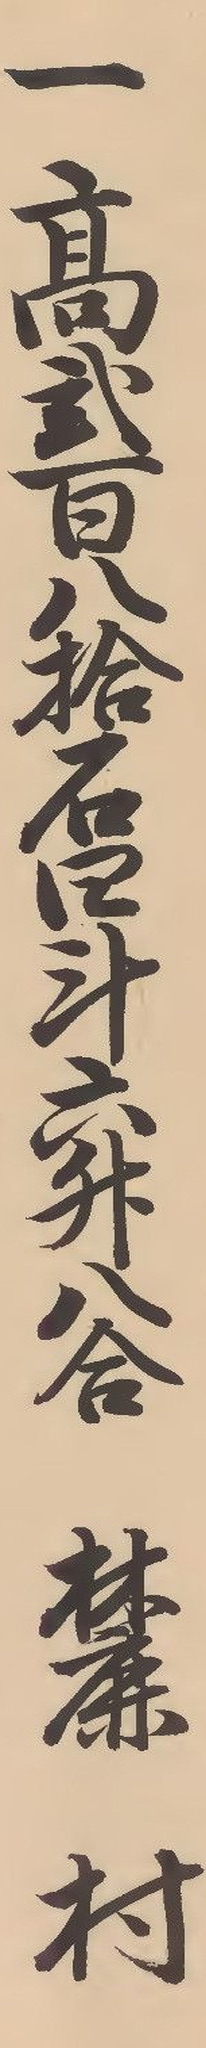一高弐百八拾石四斗六升八合麓村
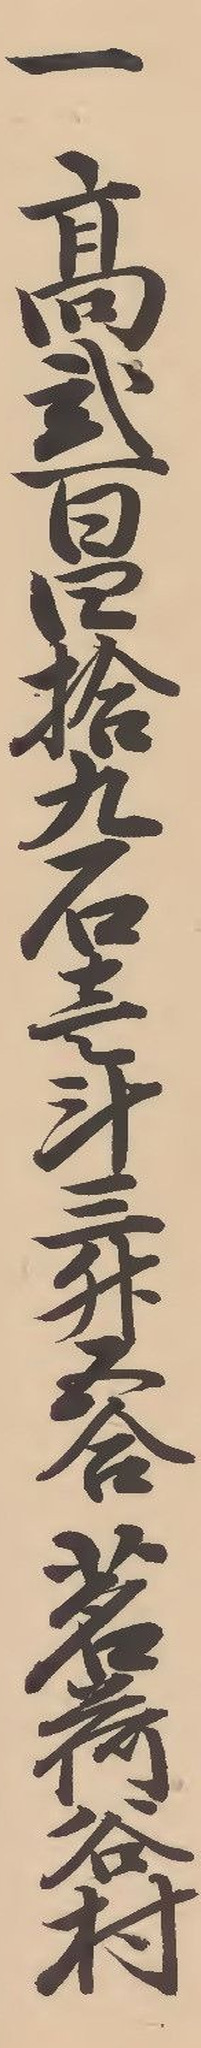一高弐百四拾九石壱斗三升五谷茗荷谷村
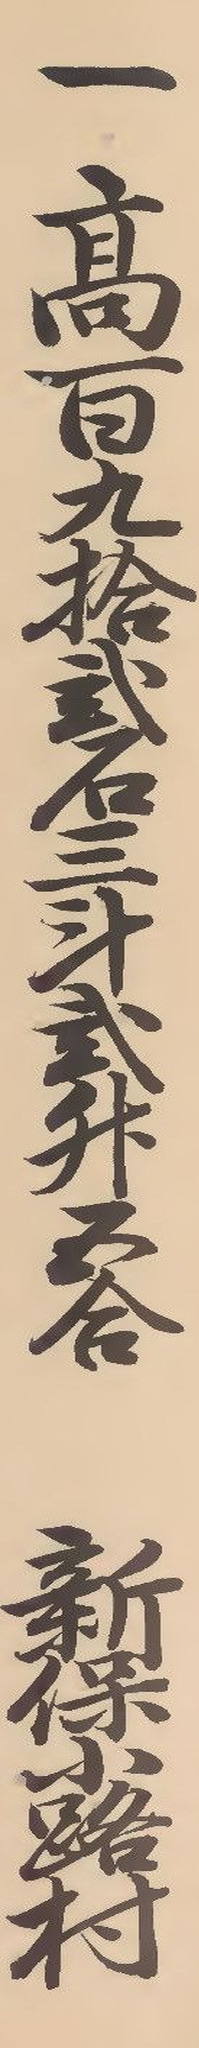一高百九拾弐石三斗弐升五合新保小路村
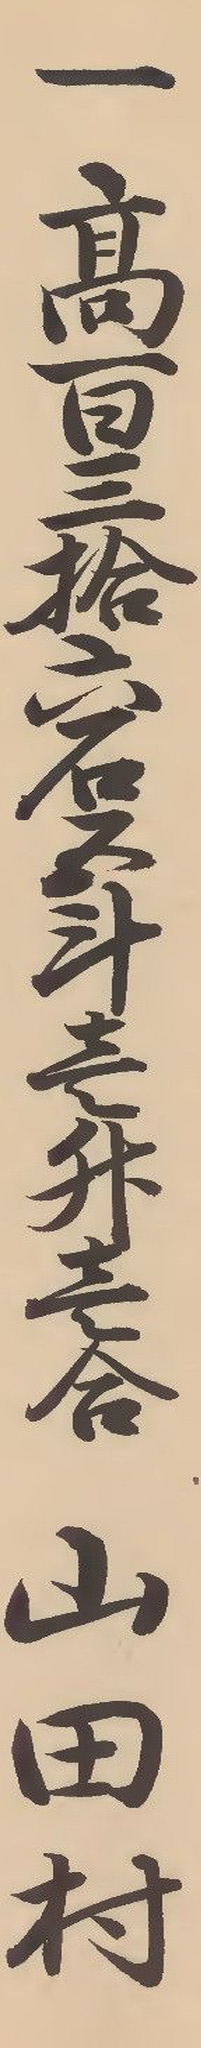一高百三拾六石五斗壱升壱合山田村
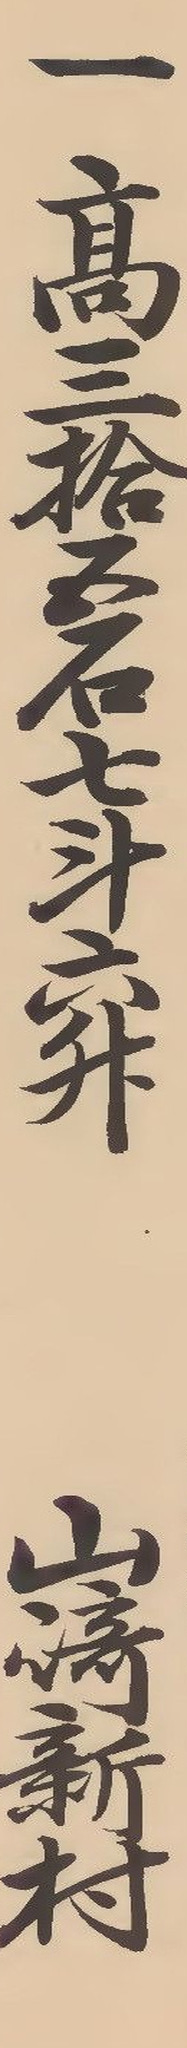一高三拾五石七斗六升山崎新村
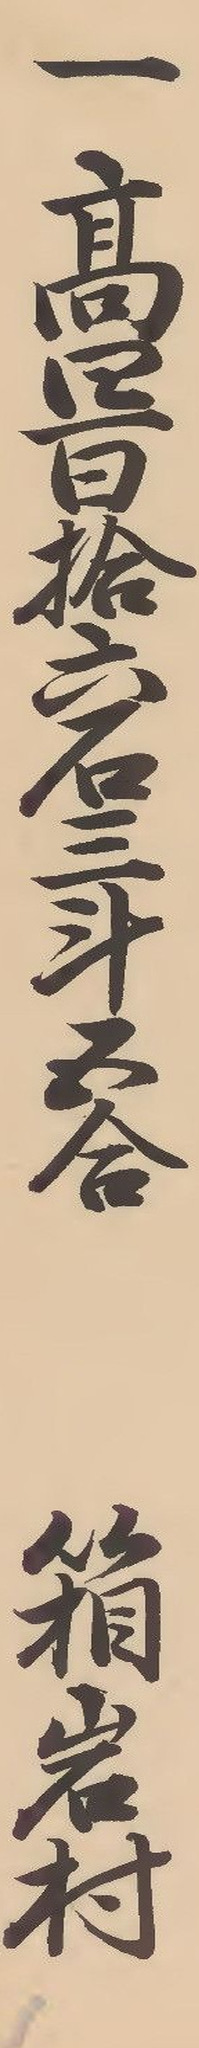一高四百拾六石三斗五合箱岩村

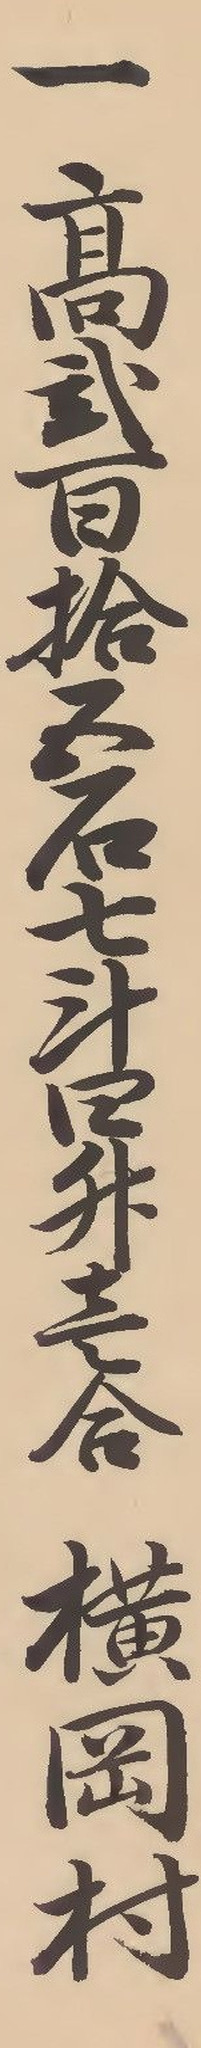一高弐百拾五石七斗四升壱合横岡村
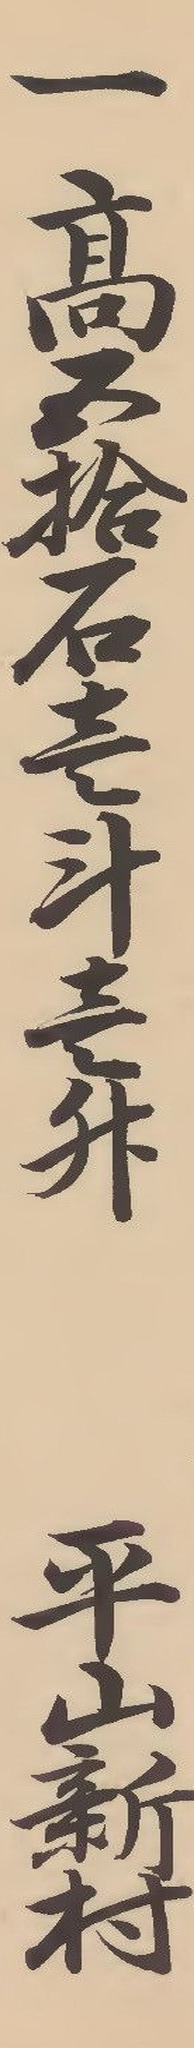一高五拾石壱斗壱升平山新村
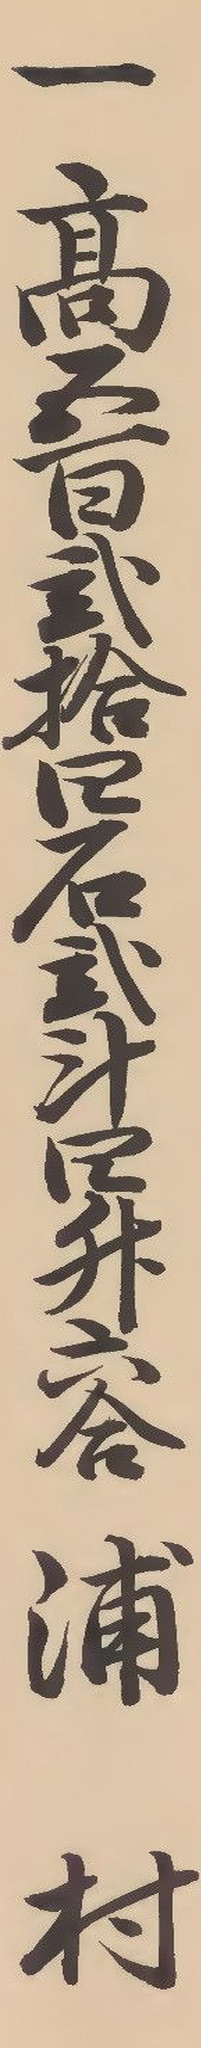一高五百弐拾四石弐斗四升六合浦村
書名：越後国郷帳　下
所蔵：国立公文書館 National Archives of Japan
